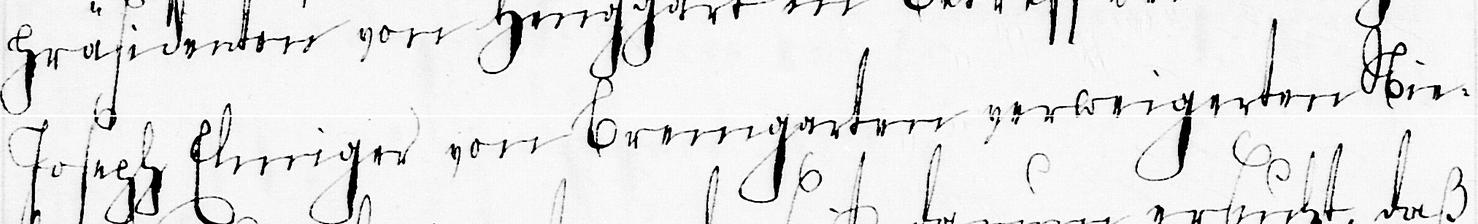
Joseph Elmiger von Bremgarten verweigerten Nie¬
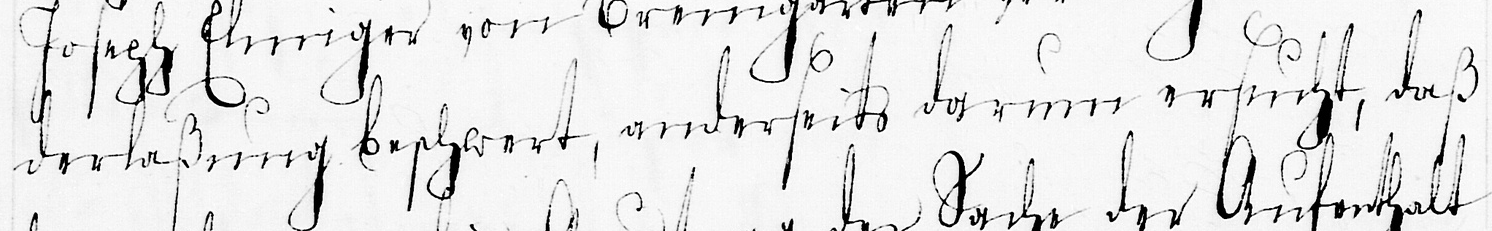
derlaßung beschwert, anderseits darum ersucht, daß
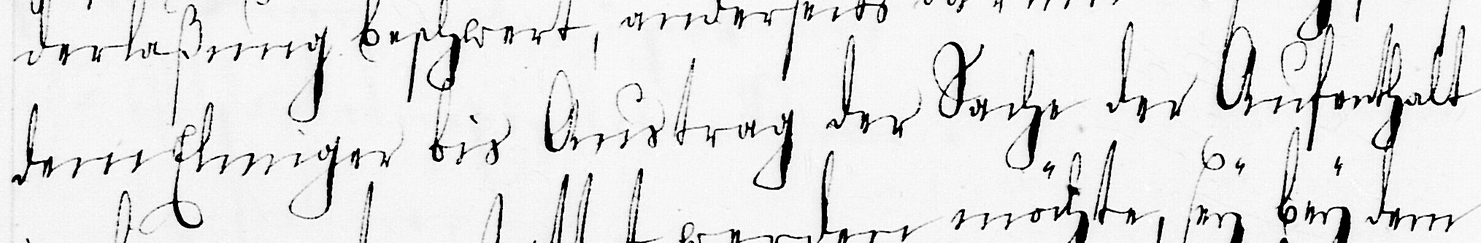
dem Elmiger bis Austrag der Sache der Aufenthalt
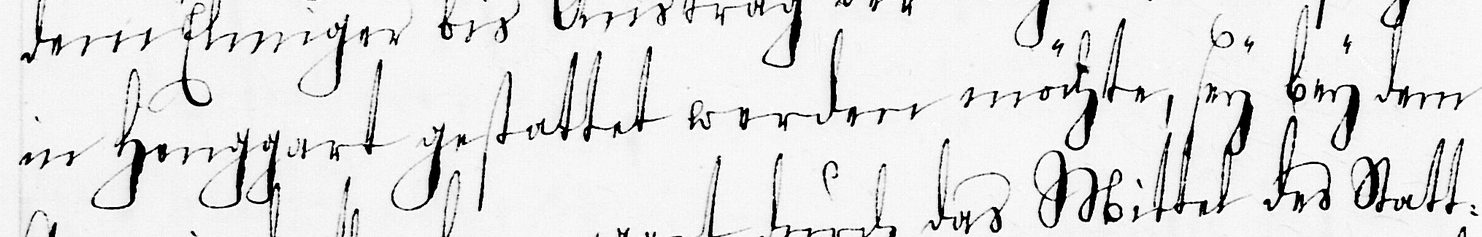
in Henggart gestattet werden möchte, sey bey dem
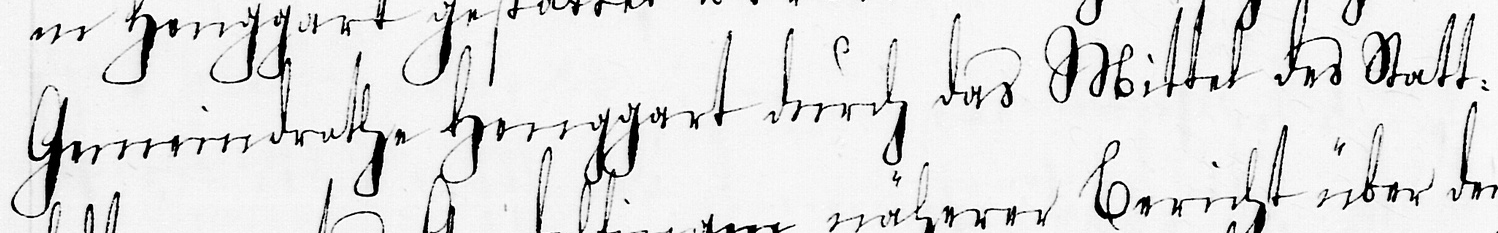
Gemeindrathe Henggart durch das Mittel des Statt¬
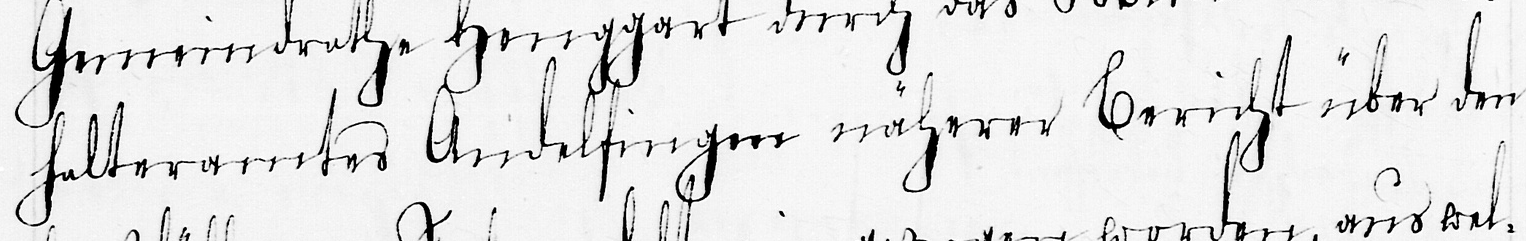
halteramtes Andelfingen näherer Bericht über den
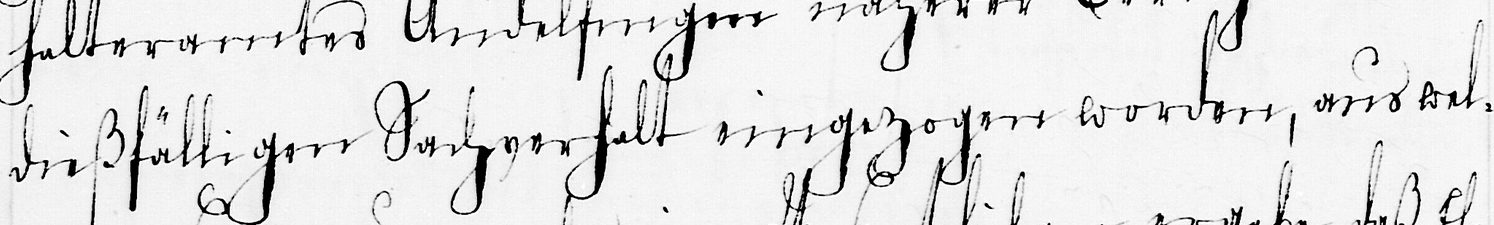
dießfälligen Sachverhalt eingezogen worden, aus wel¬
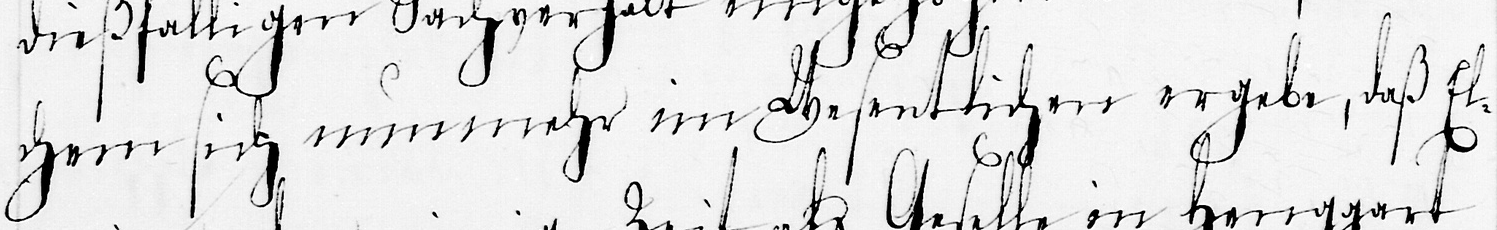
chem sich nunmehr im Wesentlichen ergebe, daß El¬
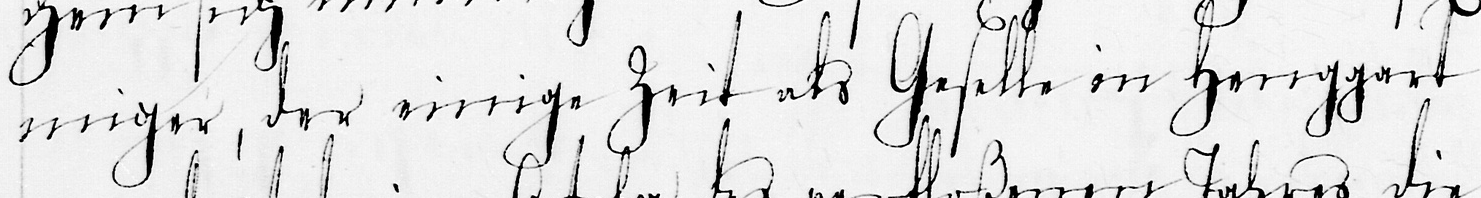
miger, der einige Zeit als Geselle in Henggart
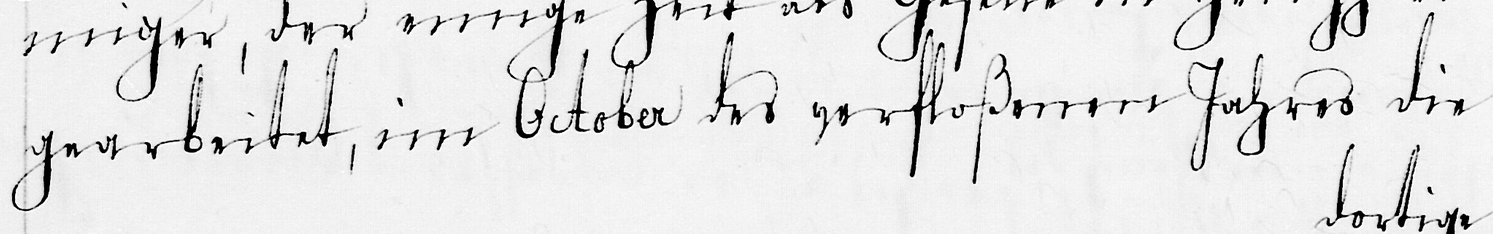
gearbeitet, im October des verfloßenen Jahres die
